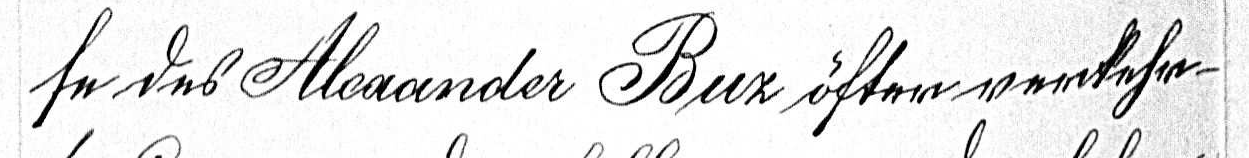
se des Alexander Buz öfter verkehr¬
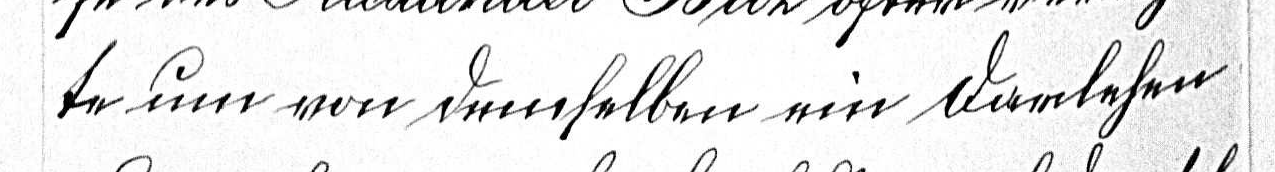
te um von demselben ein Darlehen
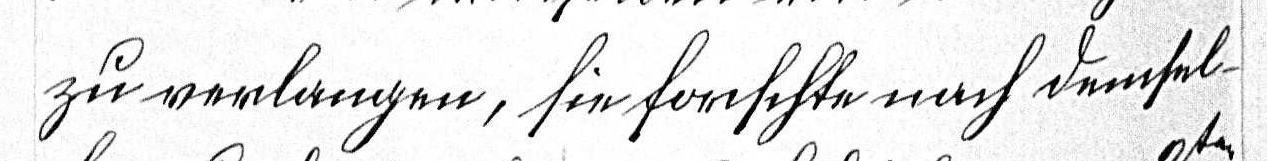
zu verlangen, sie forschte nach damsel¬
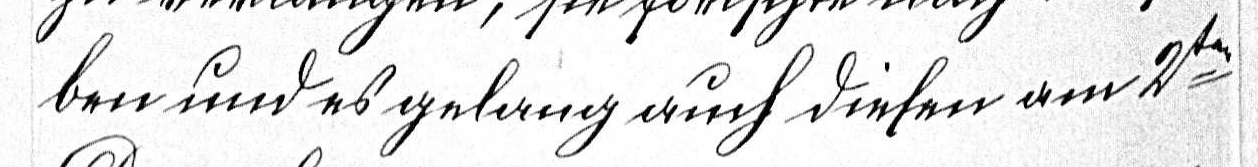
ben und es gelang auch diesen am 2ten
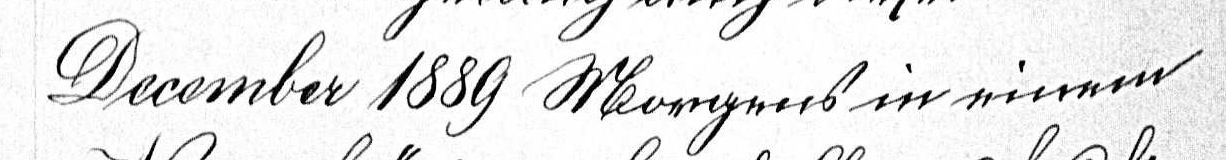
December 1889 Morgens in einem
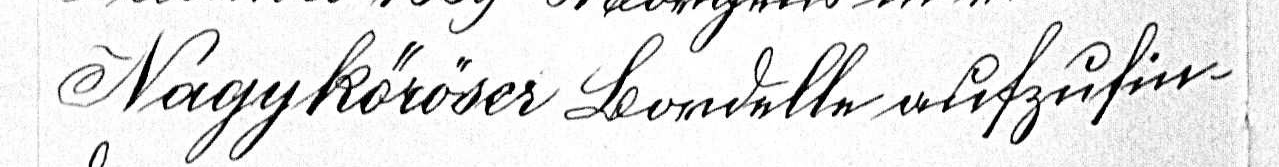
Nagykőröser Bordelle aufzufin¬
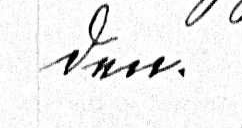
den.
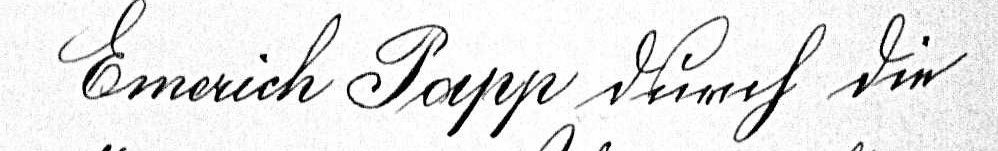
Emerich Papp durch die
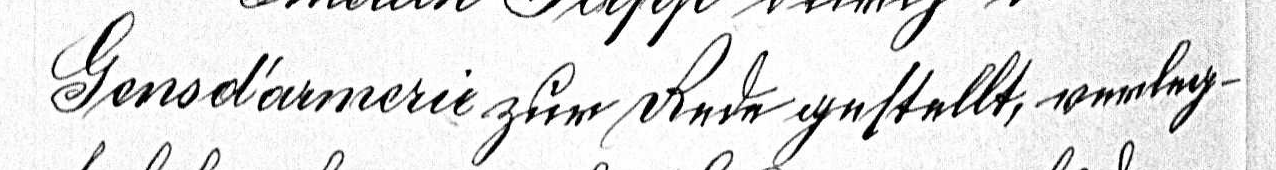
Gens d’armerie zur Rede gestellt, verleg¬
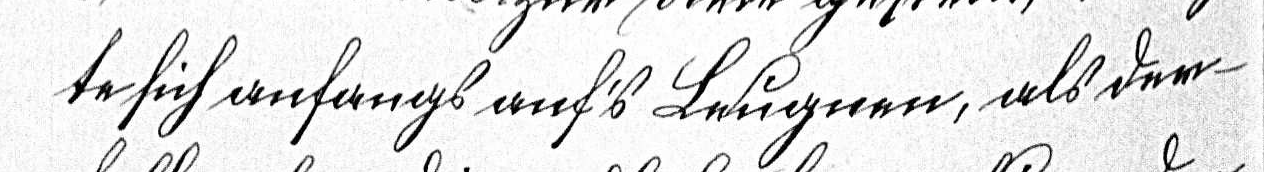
te sich anfangs auf’s Leugnen, als der¬
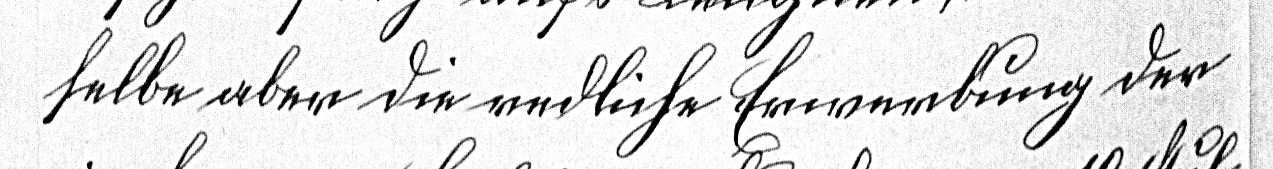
selbe aber die endliche Erwerbung der
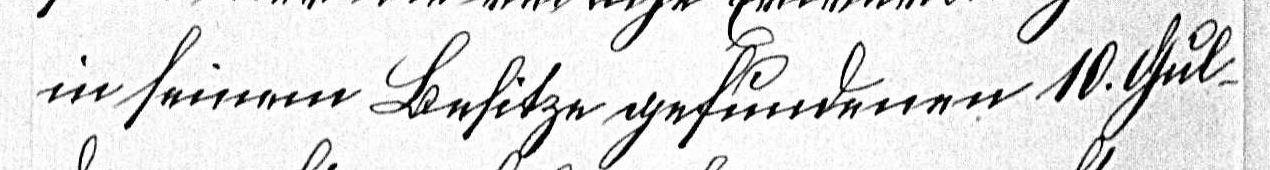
in seiner Besitze gefundenen 10 Gul¬
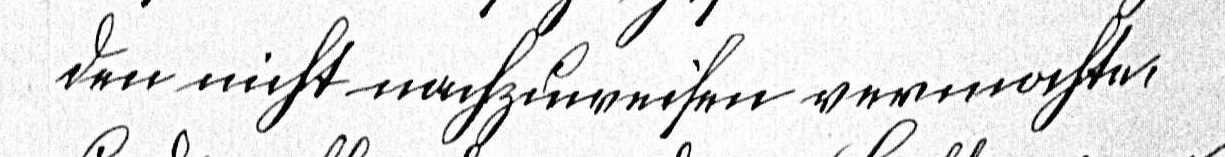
den nicht nachzuweisen vermochte,
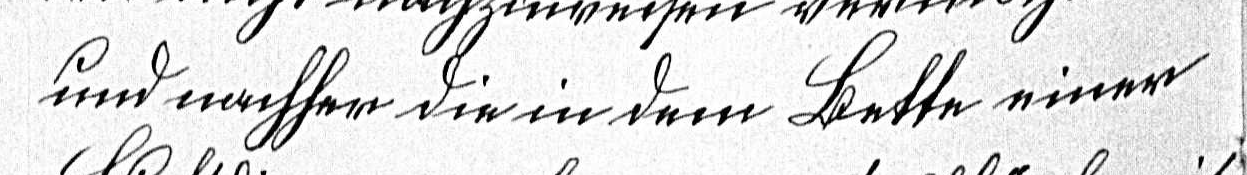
und nachher die in dem Bette einer
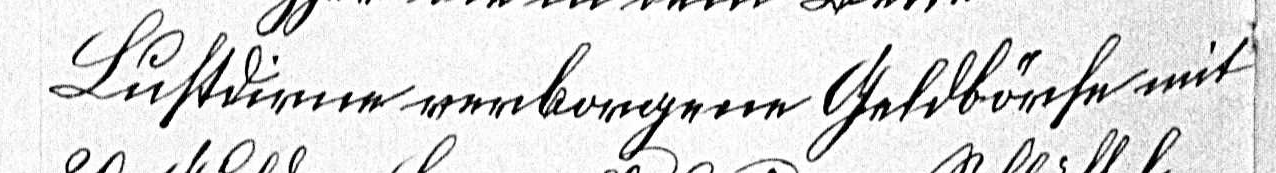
Lustdirne verborgene Geldbörse mit
